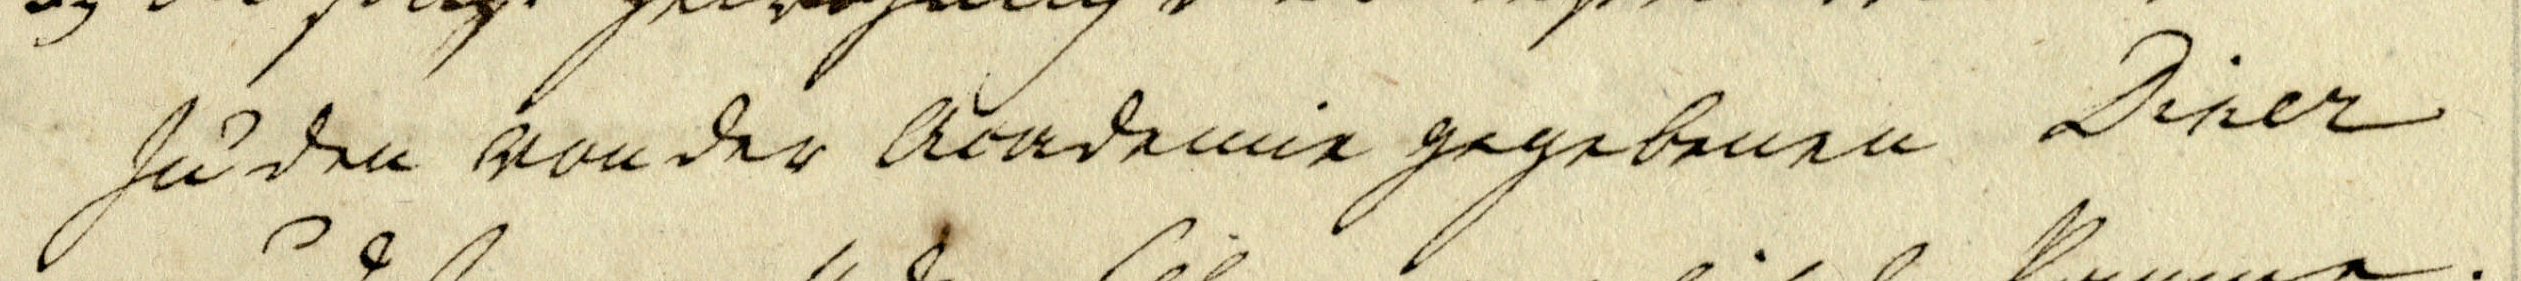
zu den von der Academie gegebenen Diner
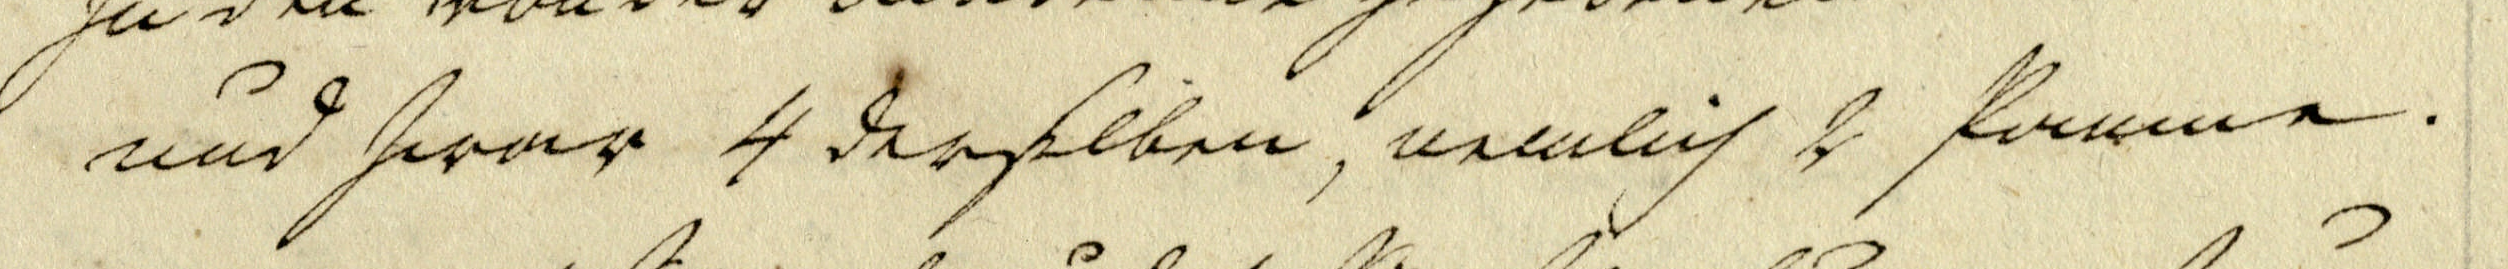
und zwar 4 derselben, nemlich 2 Pomme¬
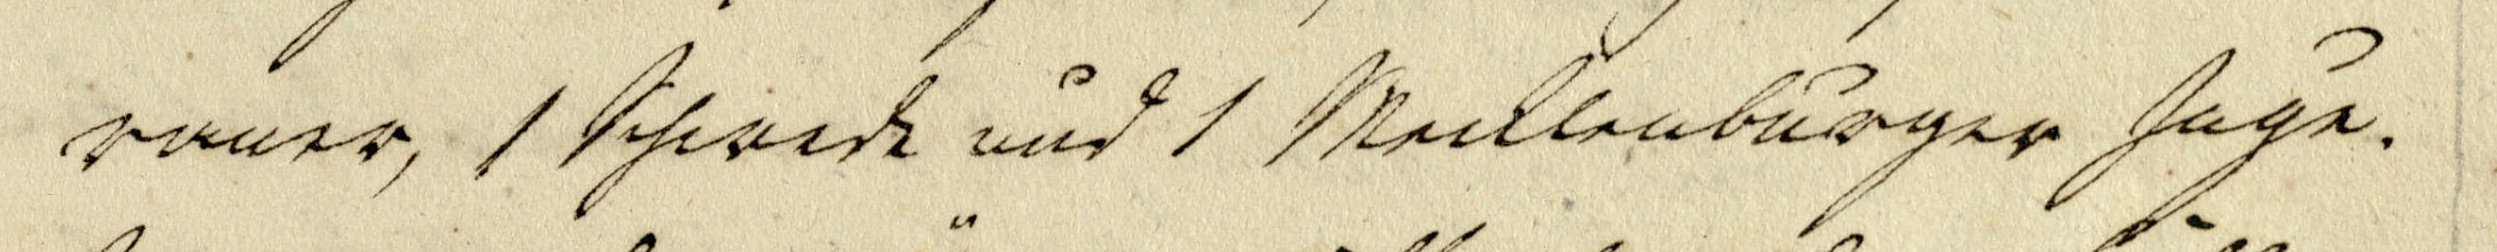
raner, 1 Schwede und 1 Mecklenburger zuge¬
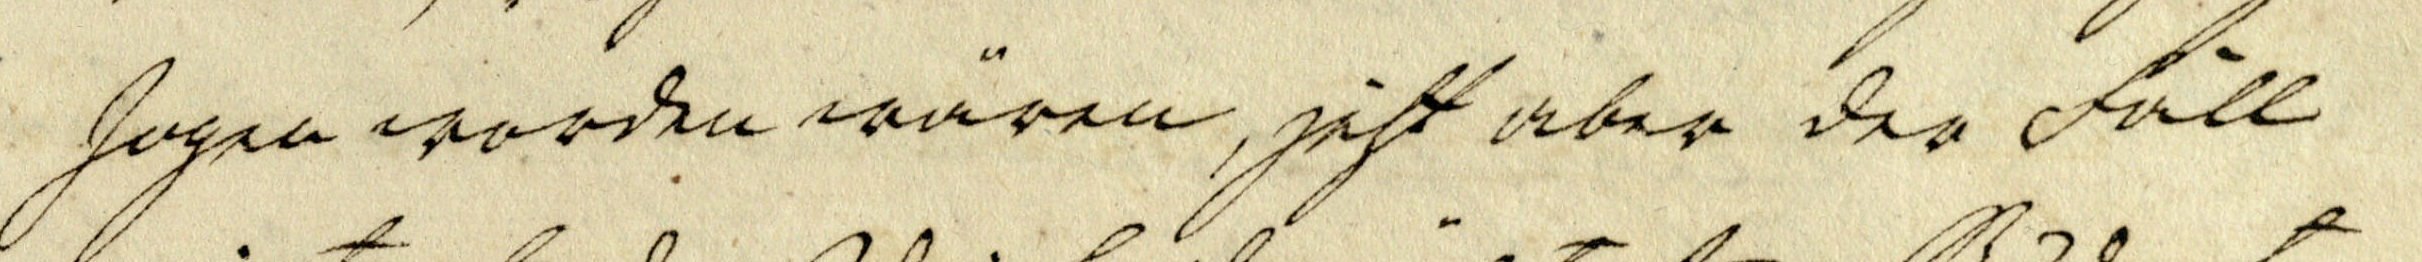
zogen worden wären, jetzt aber der Fall
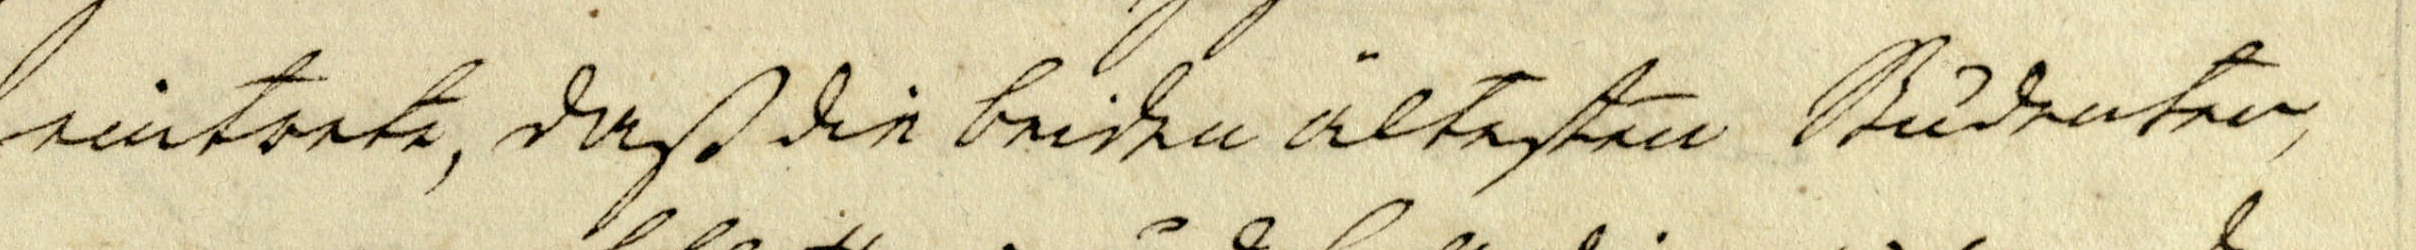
eintrete, daß die beiden ältesten Studenten,
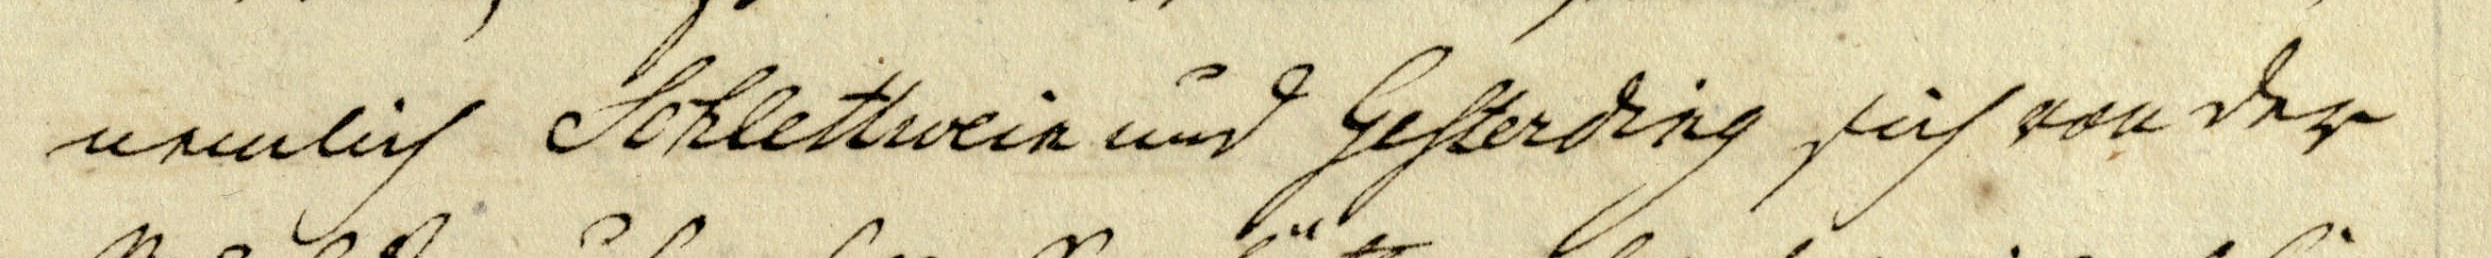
nemlich Schlettwein und Gesterding sich von der
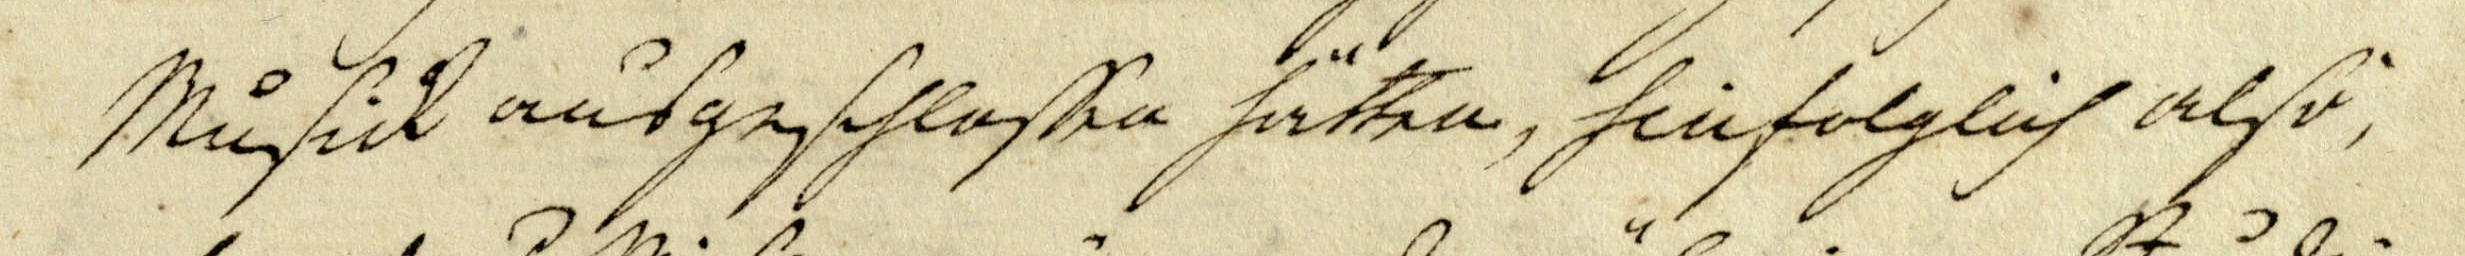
Musick ausgeschlossen hätten, hinfolglich also,
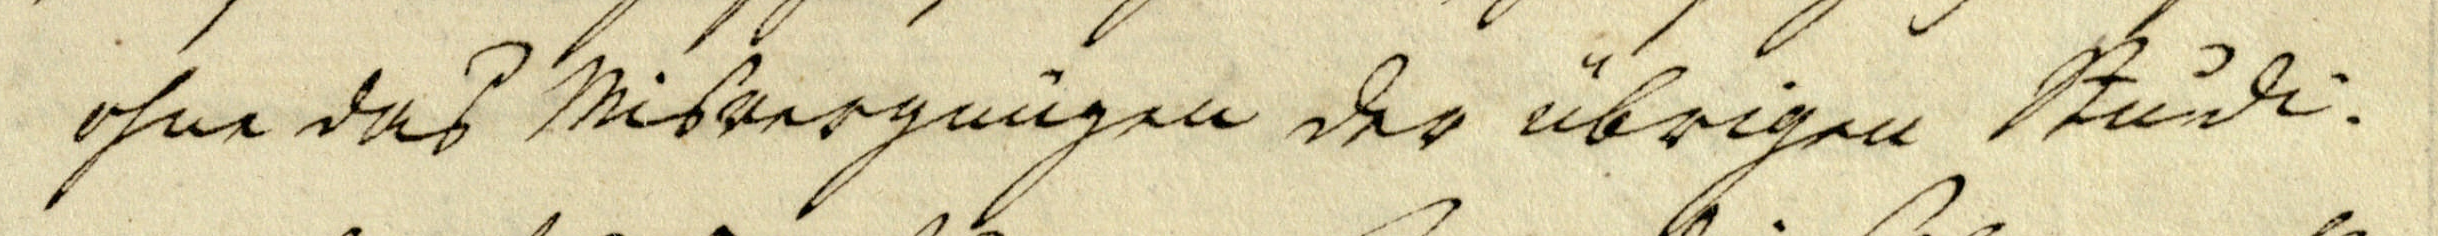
ohne das Misvergnügen der übrigen Studi¬
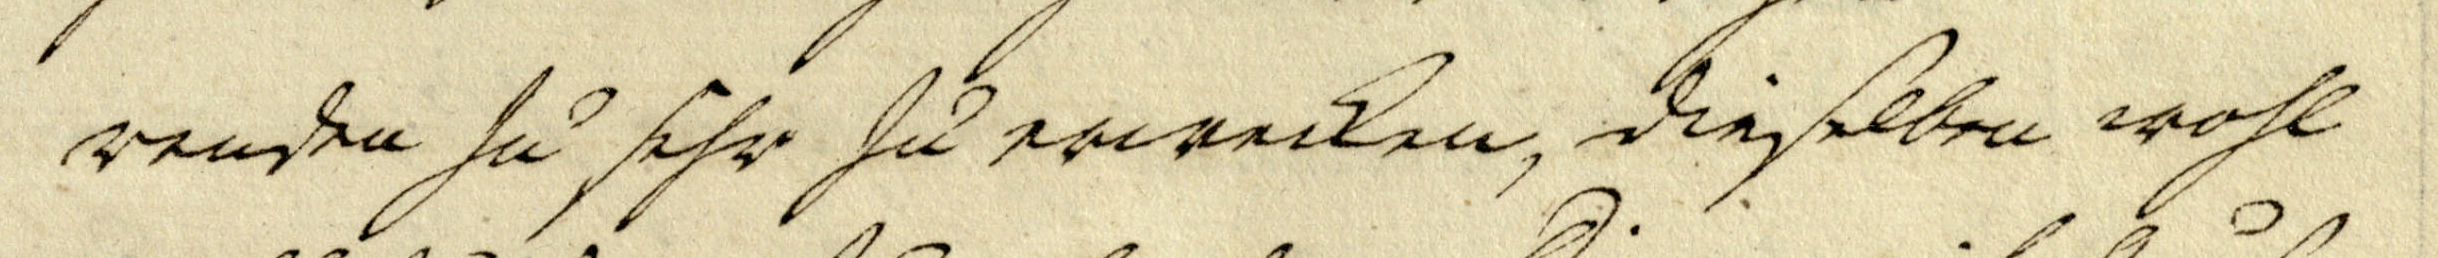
renden zu sehr zu erwecken, dieselben wohl
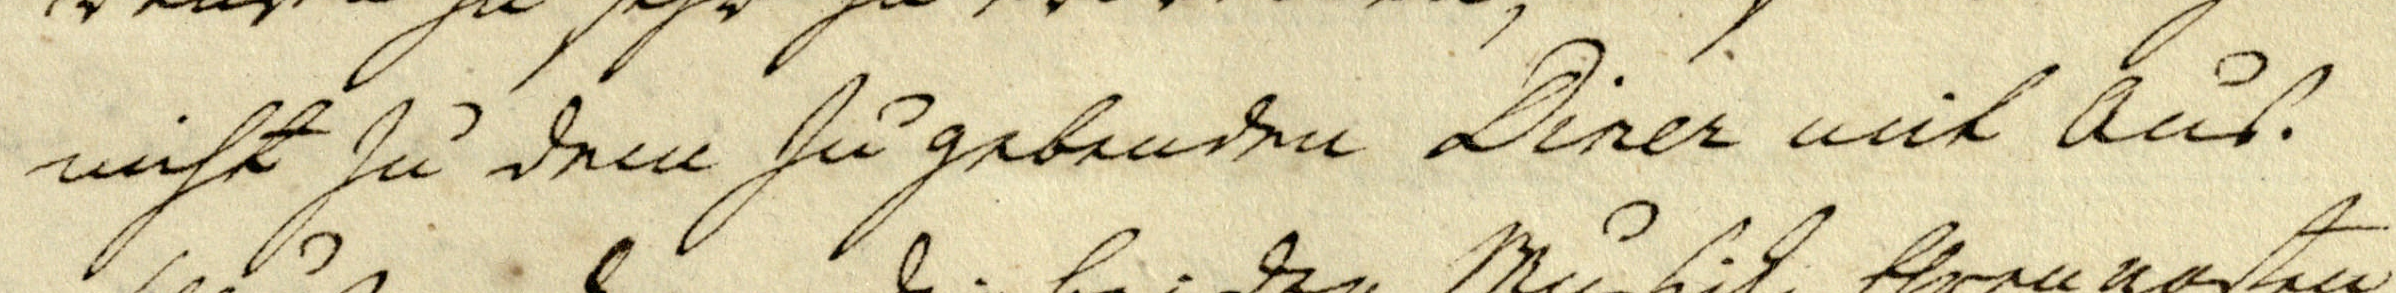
nicht zu dem zu gebenden Diner mit Aus¬
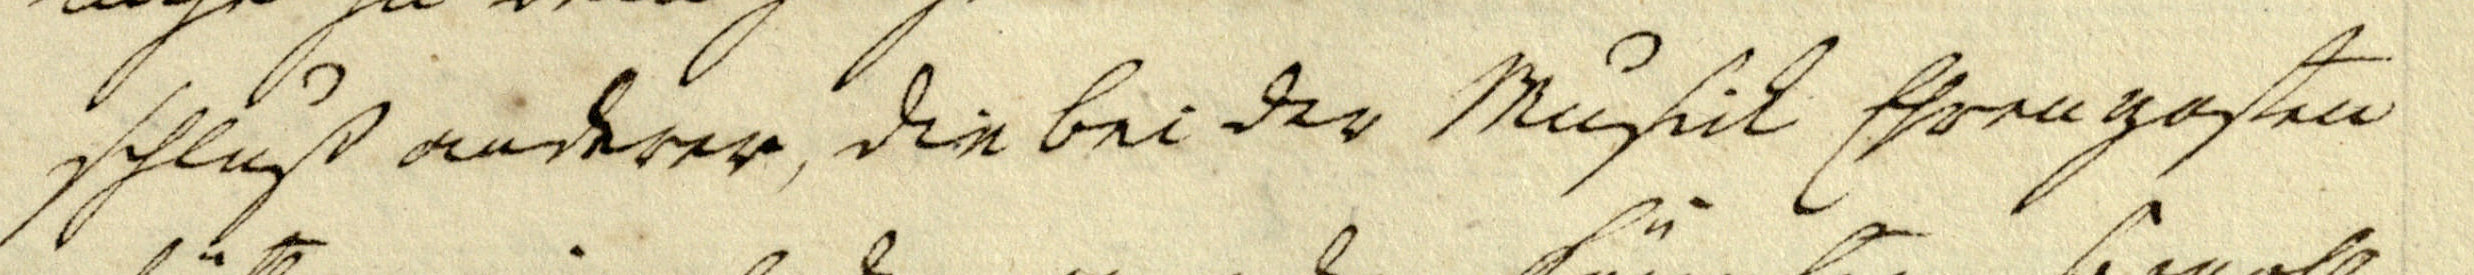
schluß anderer, die bei der Musick Ehrenposten
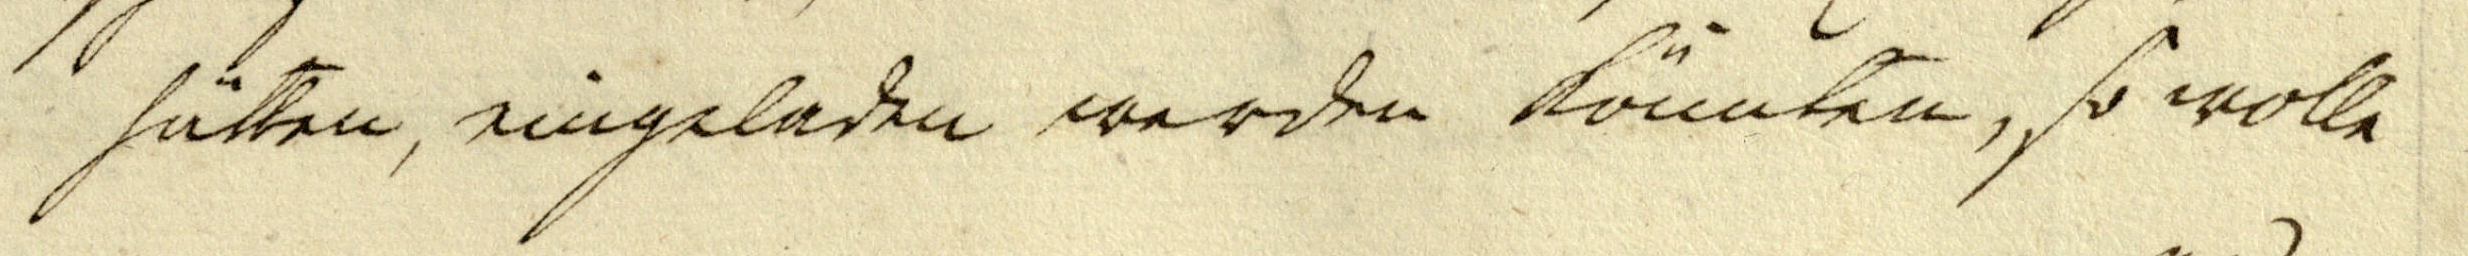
hätten, eingeladen werden könnten, so wolle
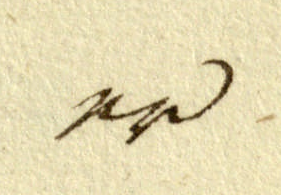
er
